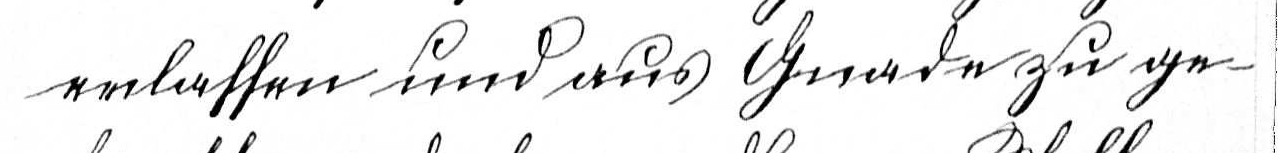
erlassen und aus Gnade zu ge¬
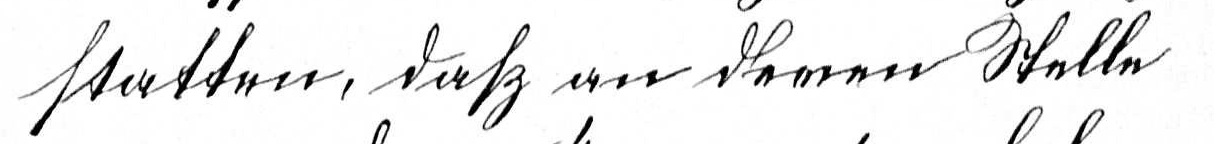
statten, daß an deren Stelle
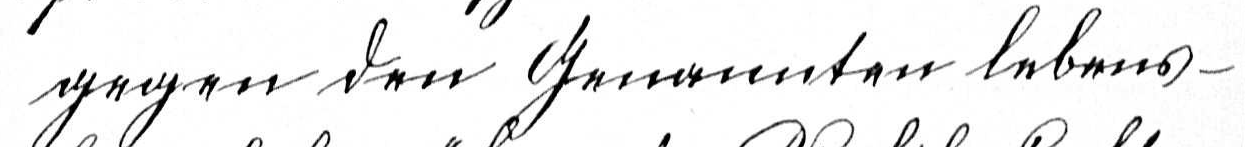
gegen den Genannten lebens¬
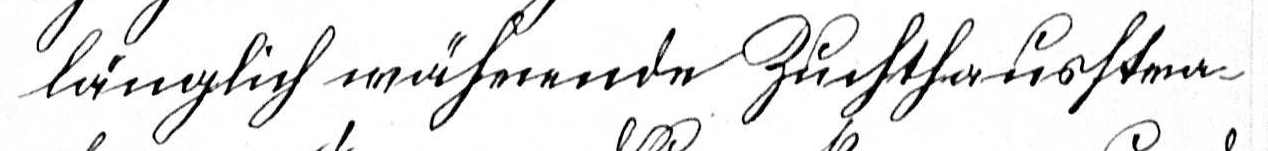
länglich währende Zuchthausstra¬
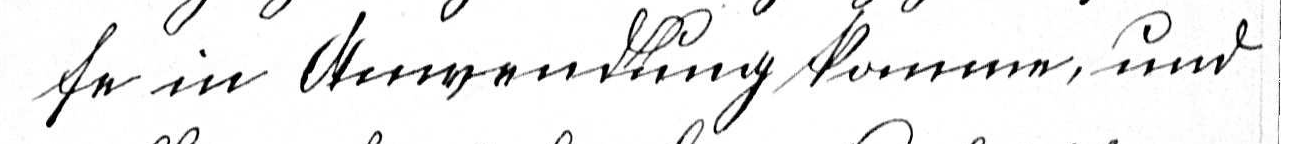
fe in Anwendung komme, und
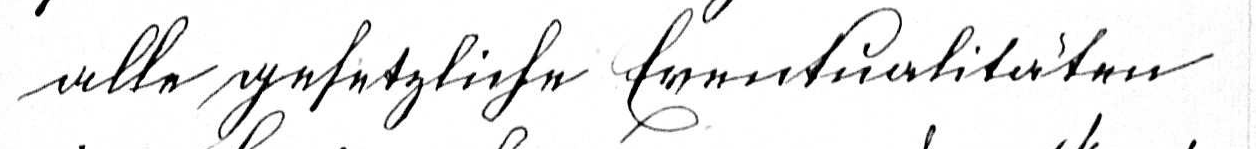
alle gesetzliche Eventualitäten
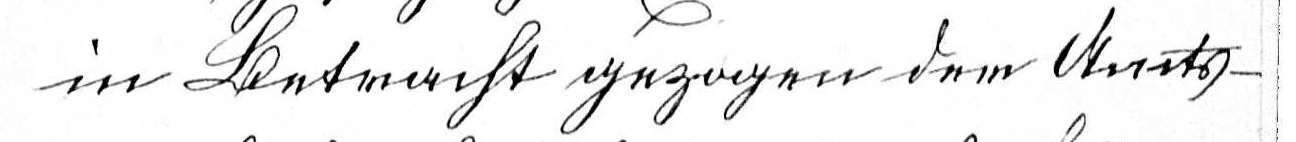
in Betracht gezogen der Amts¬
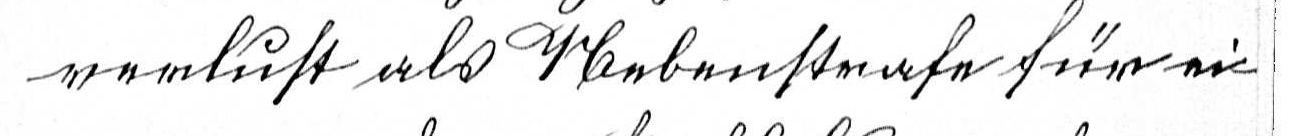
verlust als Nebenstrafe für ei¬
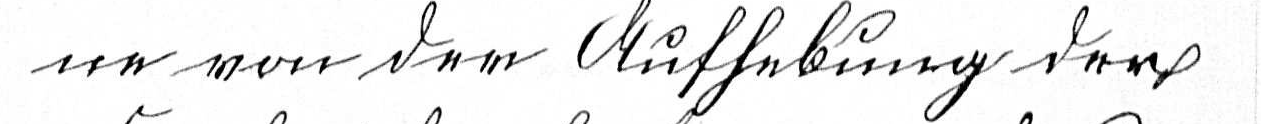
ne von der Aufhebung der
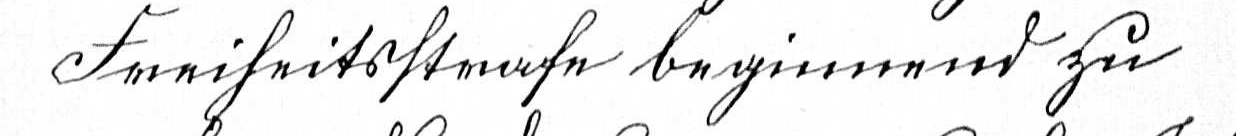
Freiheitsstrafe beginnend zu
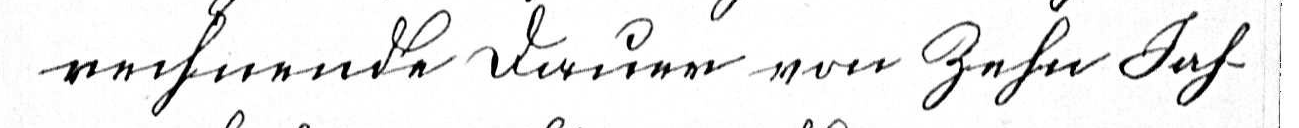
rechnende Dauer von Zehn Jah¬
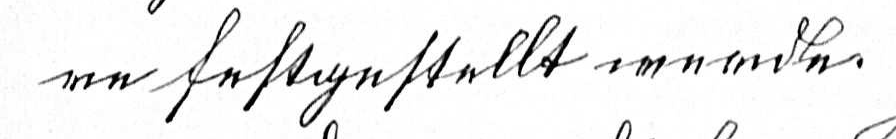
re festgestellt werde.
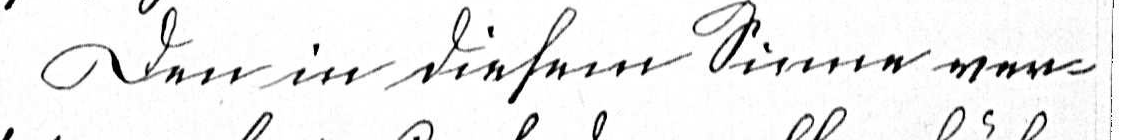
Den in diesem Sinne ver¬
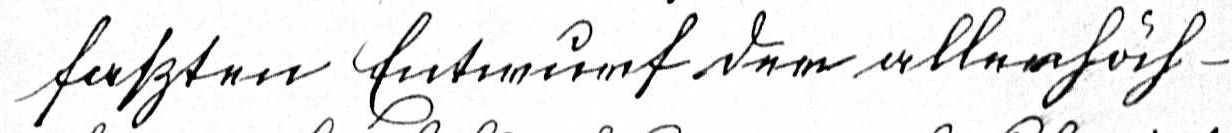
faßten Entwurf der allerhöch¬
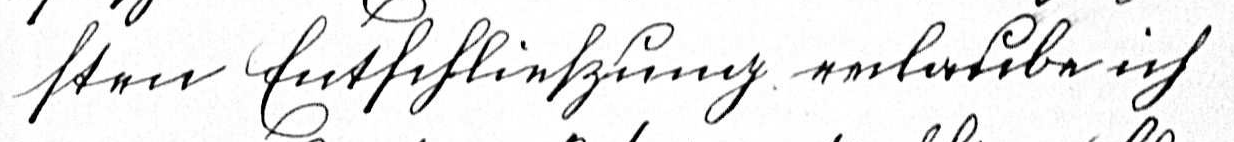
sten Entschließung erlaube ich
